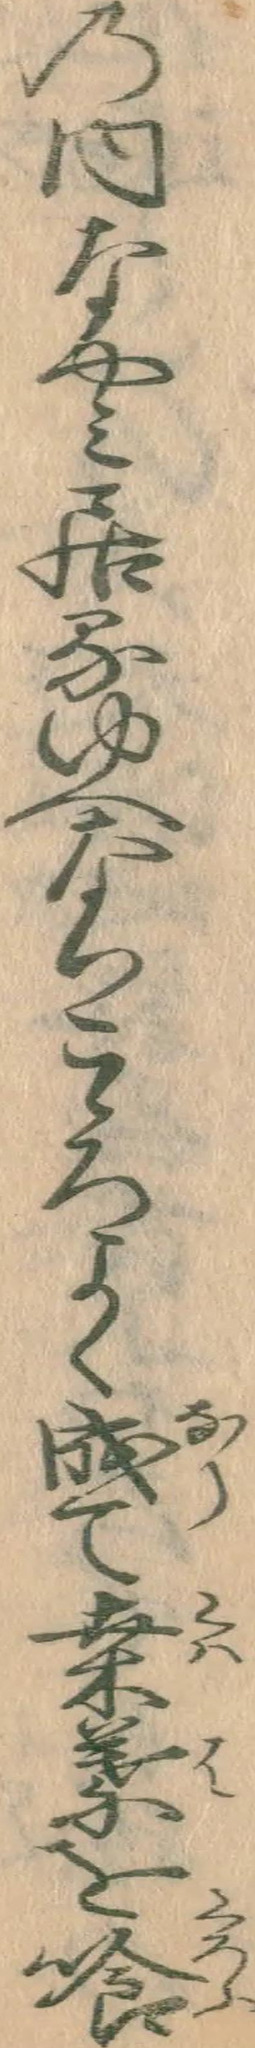の内なやみ居るゆへなりこゝろよく成て桑葉を喰
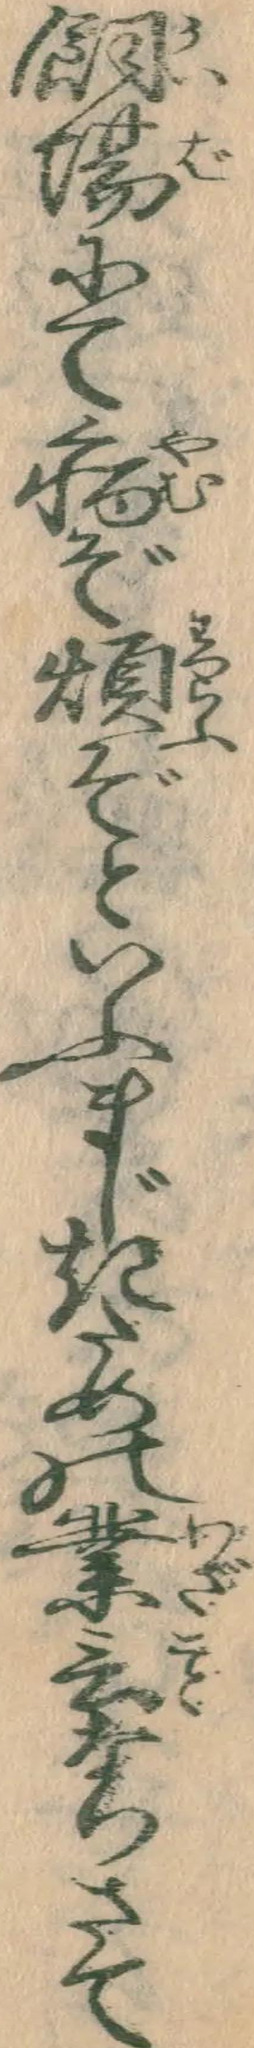飼場にて病ぞ煩ぞといふまじきための業言なりさて
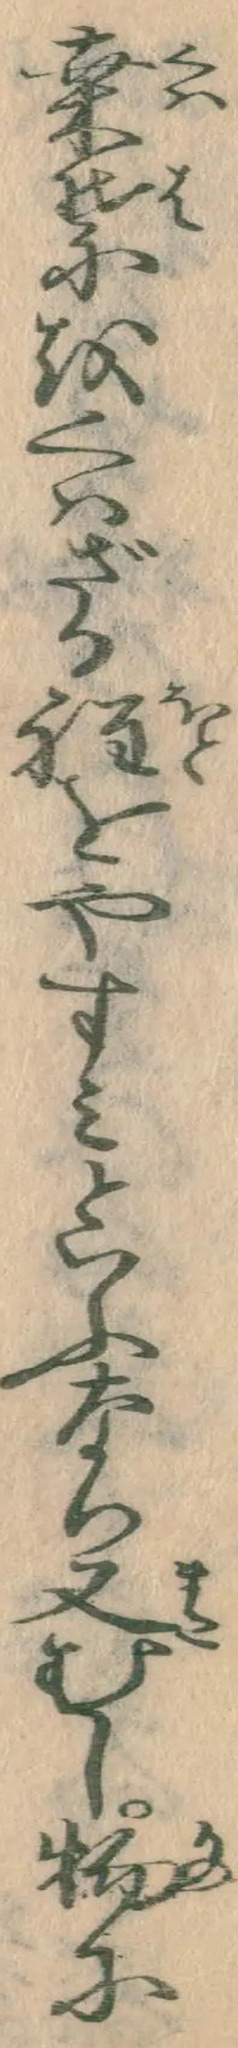桑葉をくはざる程をやすみといふなり又むし。物に
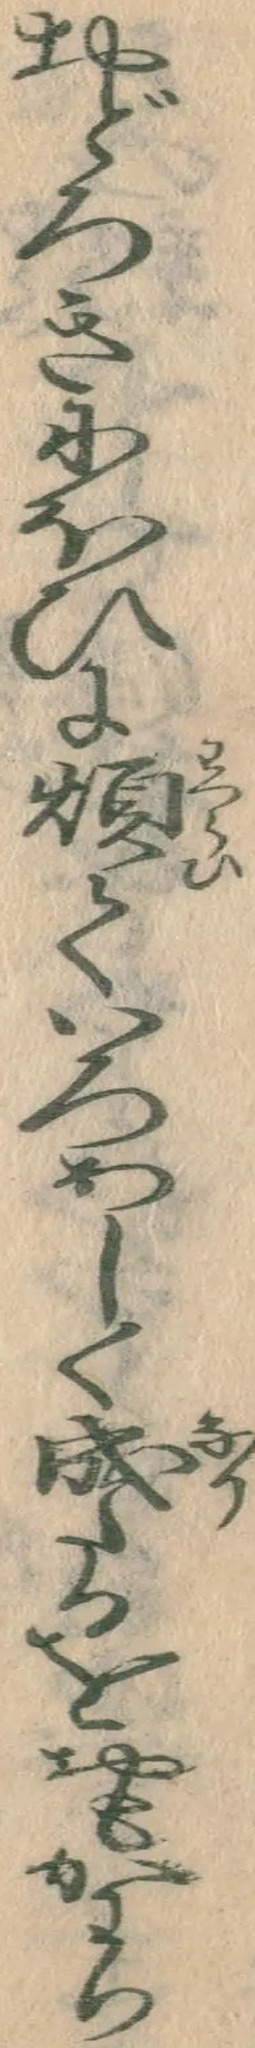おどろきにほひに煩ていろあしく成たるをおもかわり
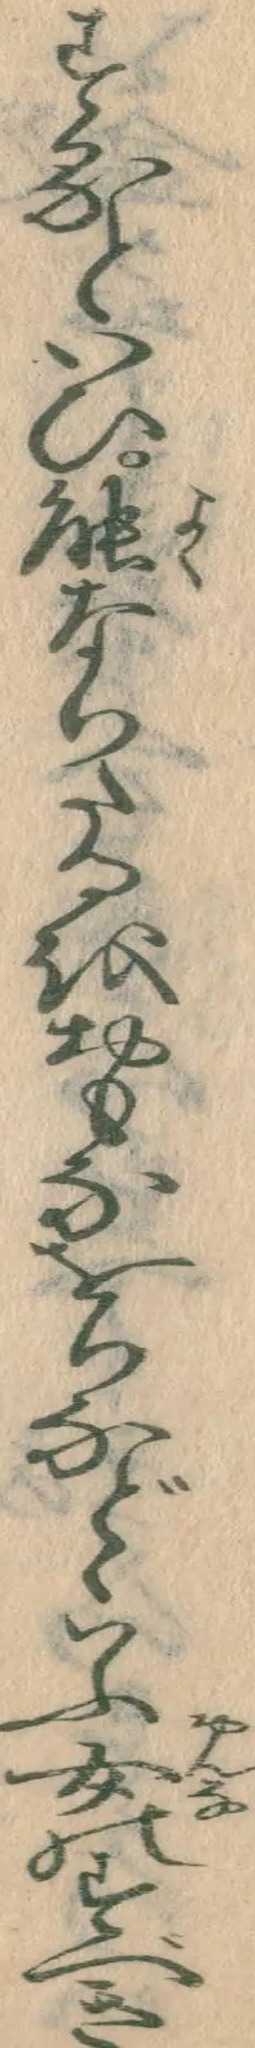するといひ。能なりたるをおもなをりなどゝいふ女のすべき
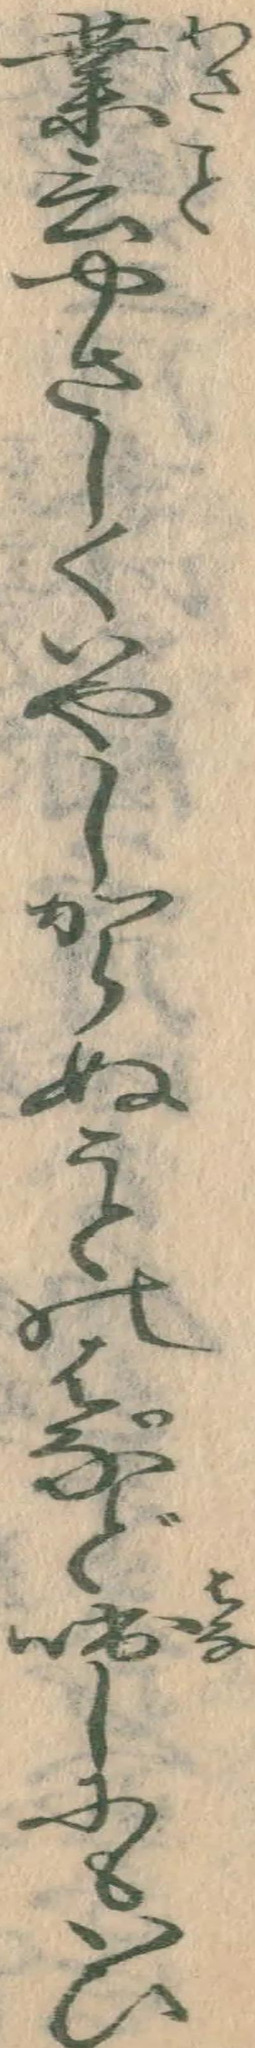業言やさしくいやしからぬことのは。など咄しにもいひ
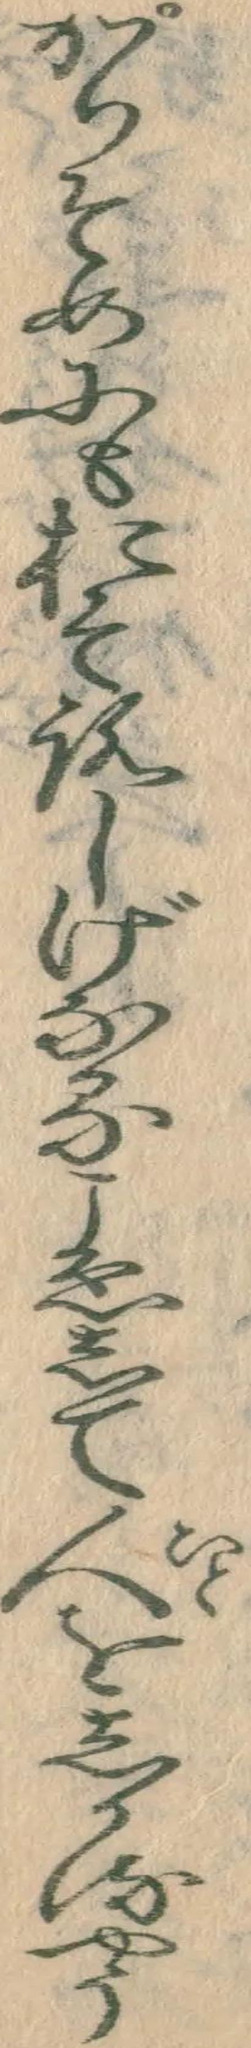。かりそめにもおそろしげなるこゑして人をしかるやう
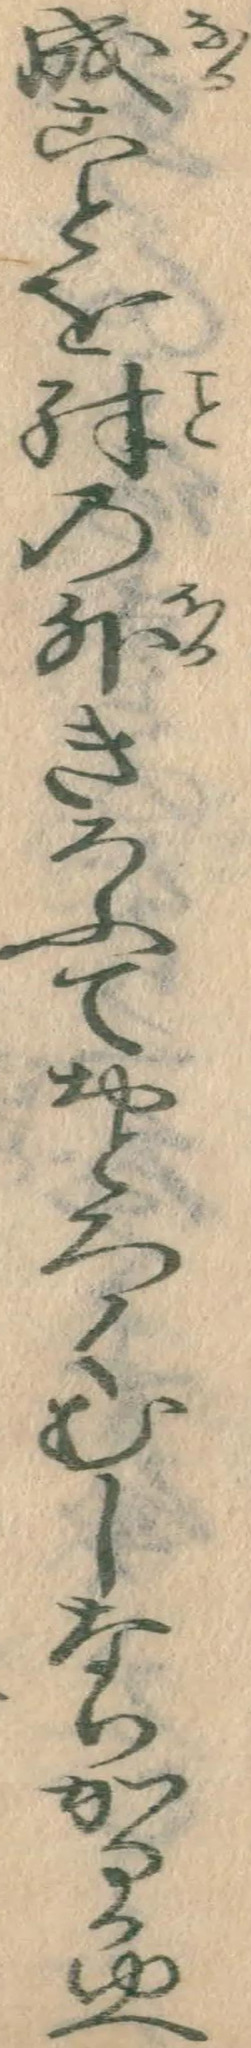成ことを殊の外きろふておとろくむしなりかるかゆへ
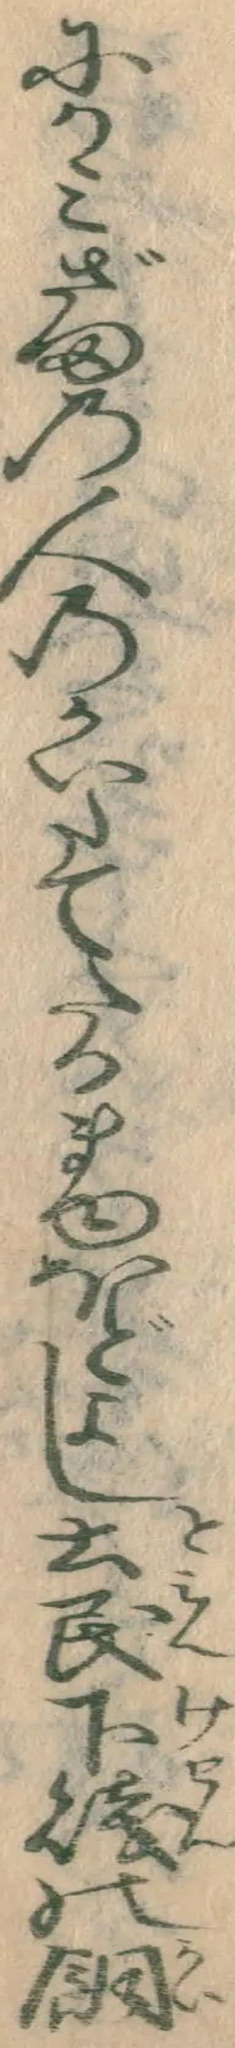にかみざまの人のかいたてたるまゆほどよし土民下賤の飼
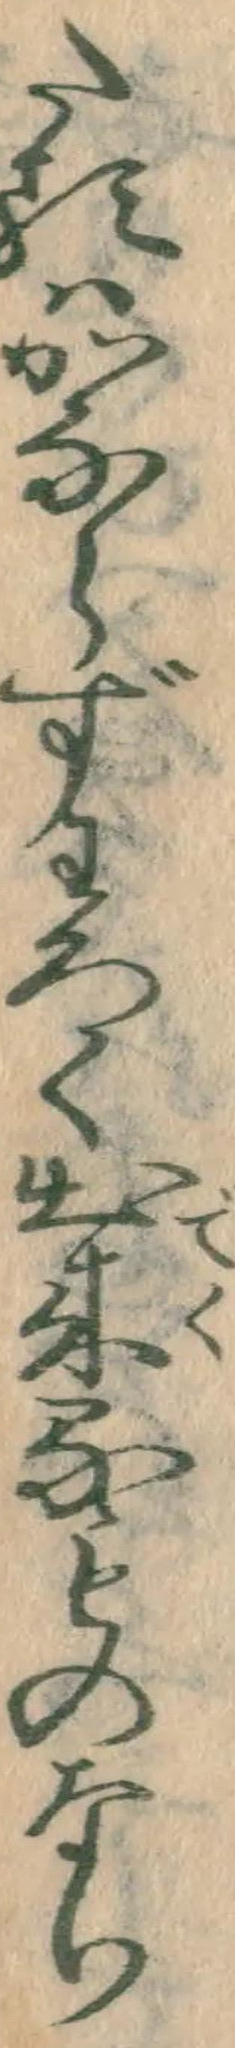たるはかならずわろく出来るものなり

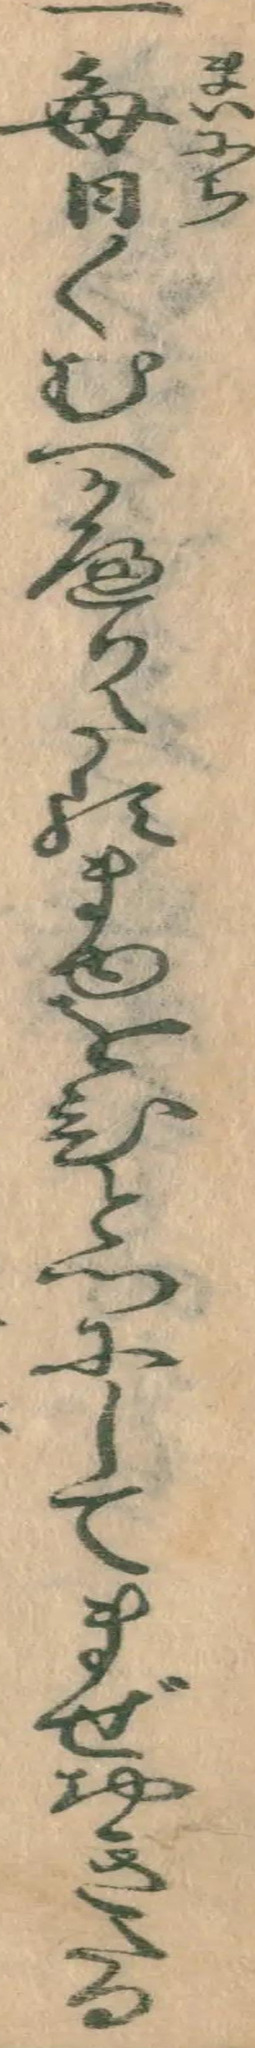一毎日〳〵むへかへりたるまゆをひとつにしてまぜおきたる
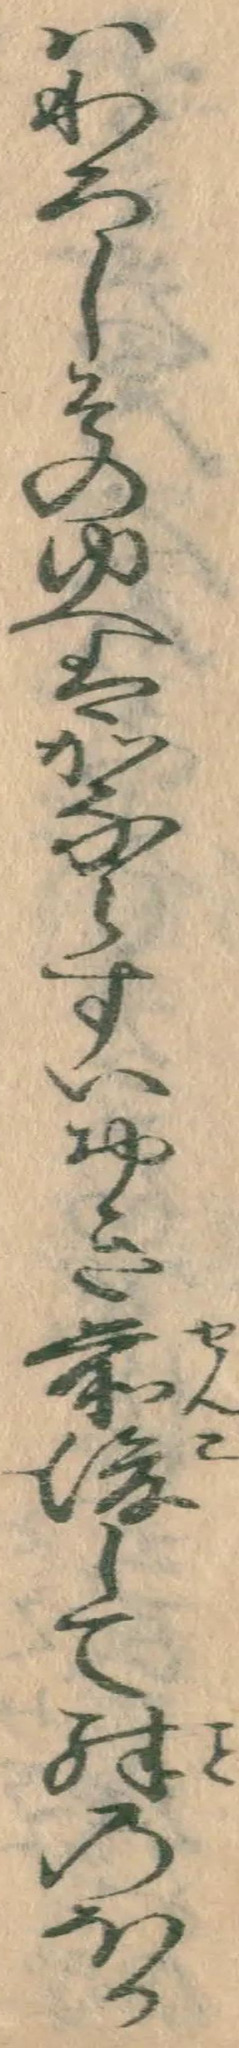はわろしそのゆへはかならすいおき前後して殊のほか
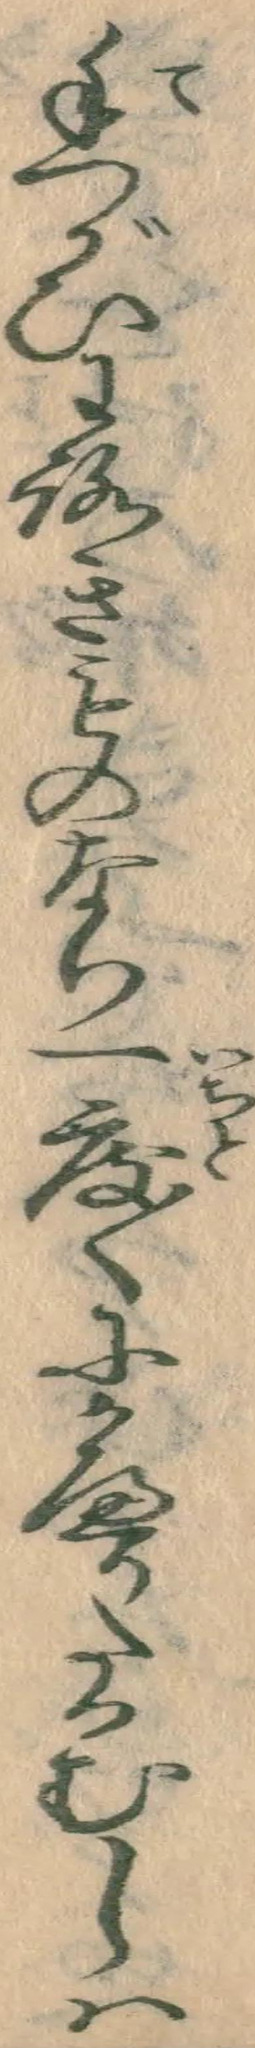手つがひわろきものなり一度〳〵にかへりたるむしは
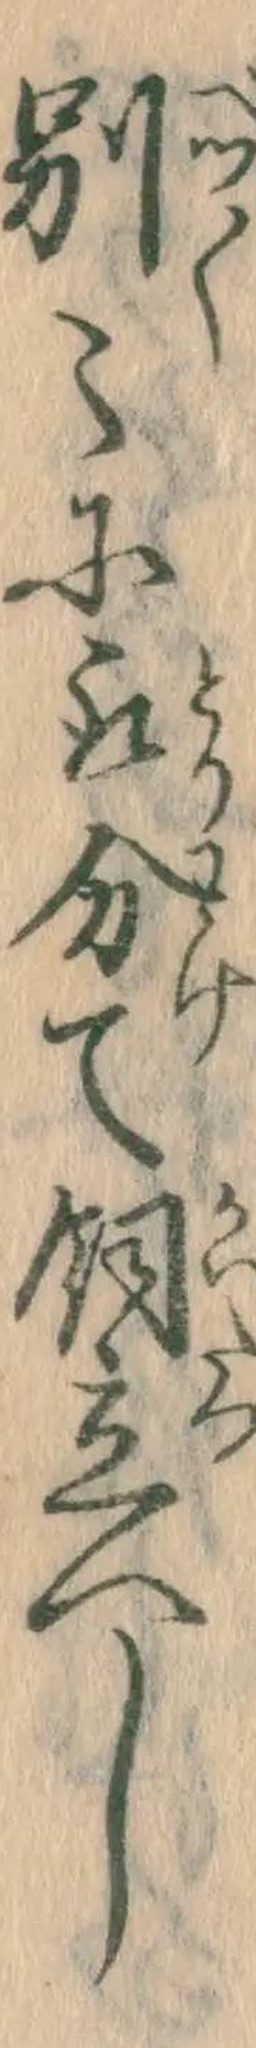別々に取分て飼立へし
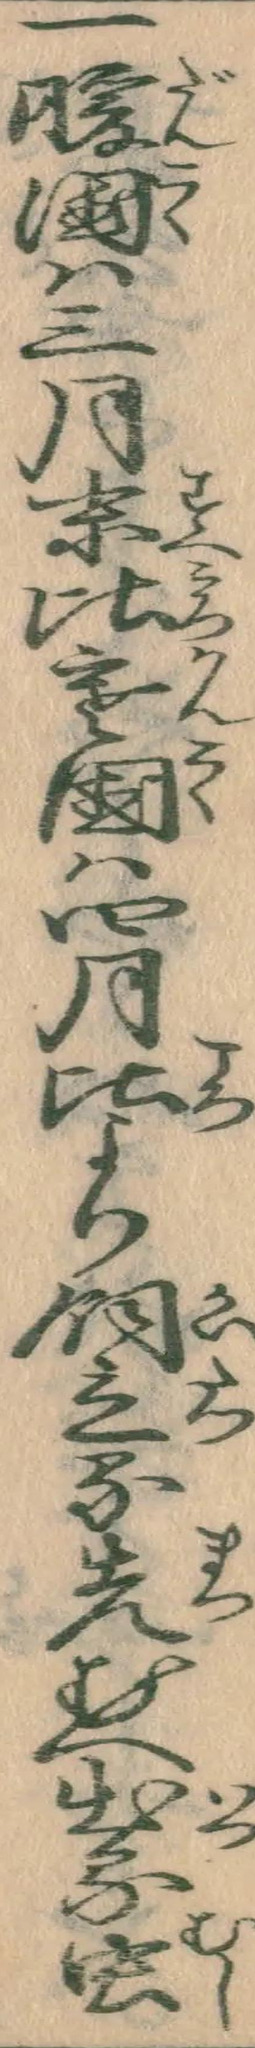一暖国は三月末比寒国は四月比より飼立る先むへ出る虫
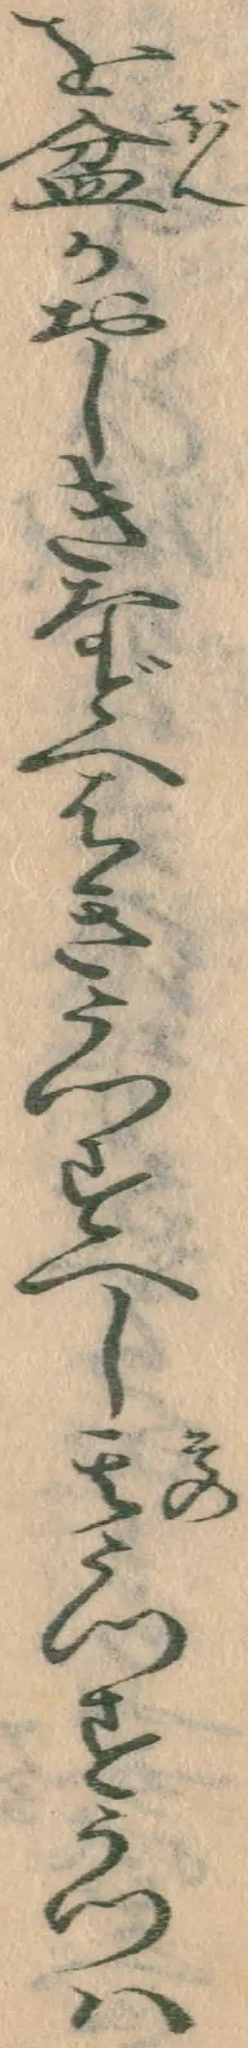を盆かおしきなどへはきうつすへし其うつすうつは
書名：蚕飼養法記
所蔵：国立国会図書館 National Diet Library, JAPAN
